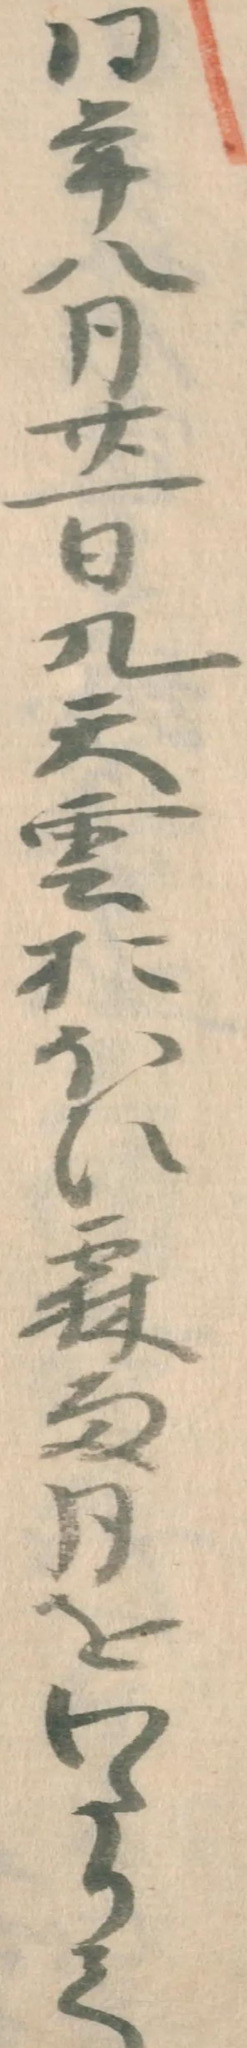同年八月廿一日九天雲おほひ霖雨月をわたりて
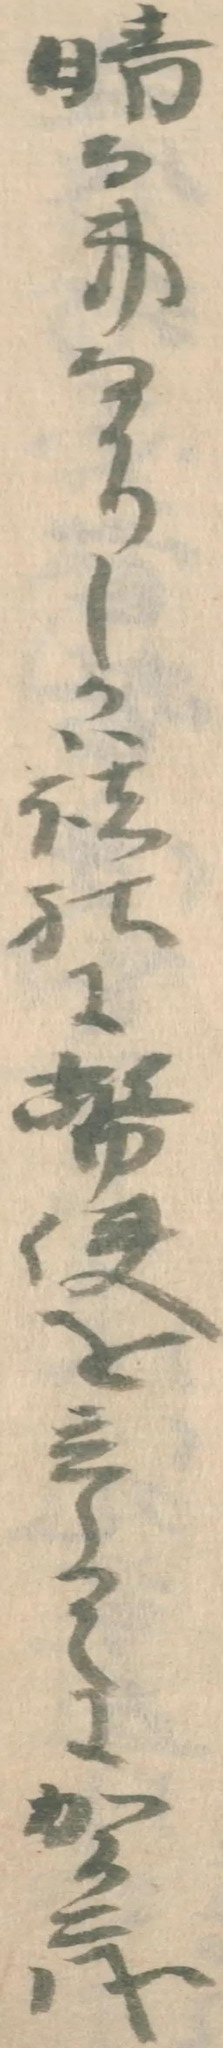晴る事なかりしかは諸社に幣使を立らるゝに賀茂
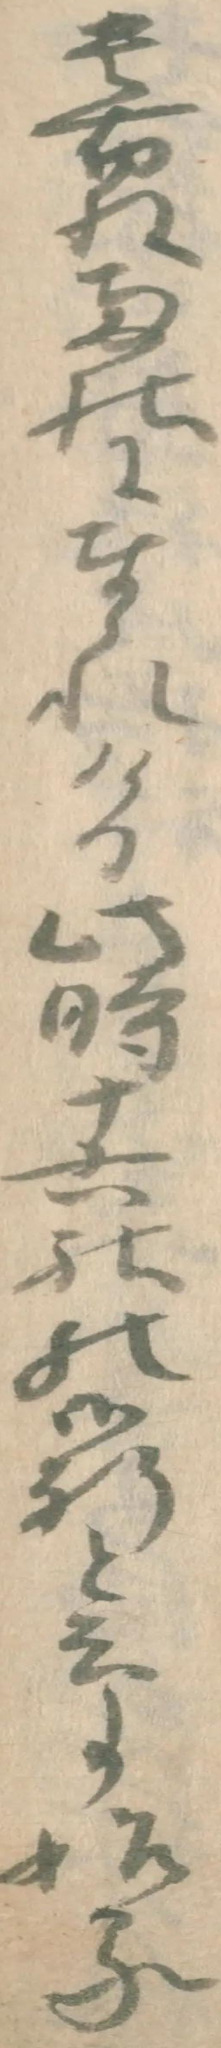貴ふね両社に奉られける此時十六社の御祈と云事始る

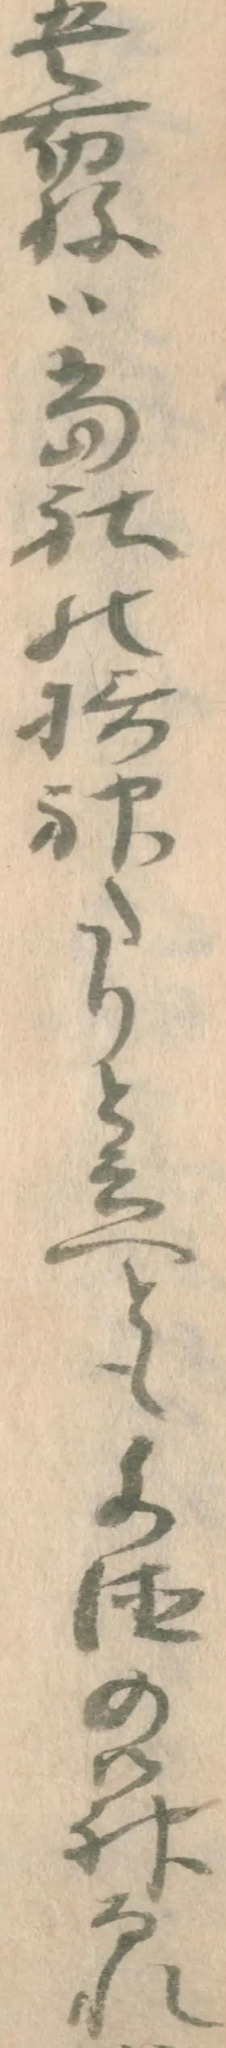貴ふねは当社の摂神たりと云へとも水徳の御神なれは
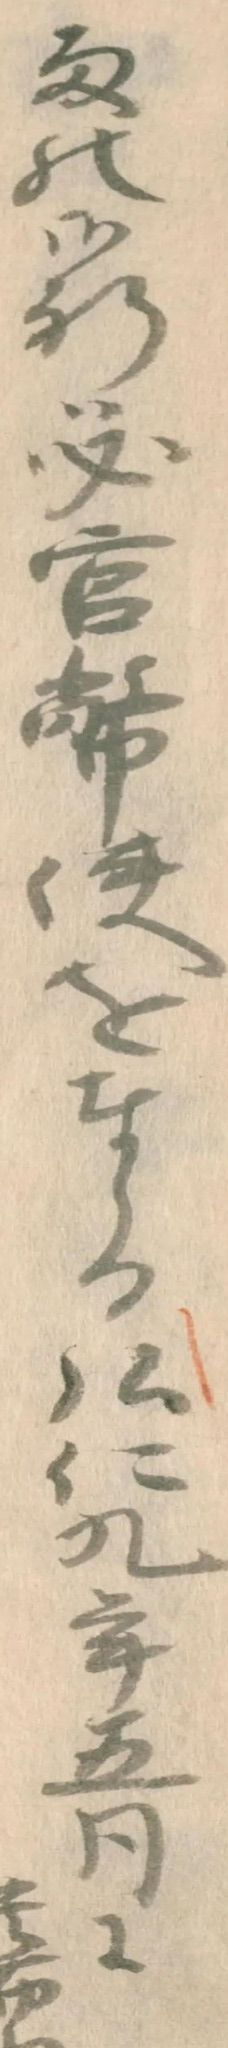雨の御祈は必官幣使を奉らる弘仁九年五月に貴ふね
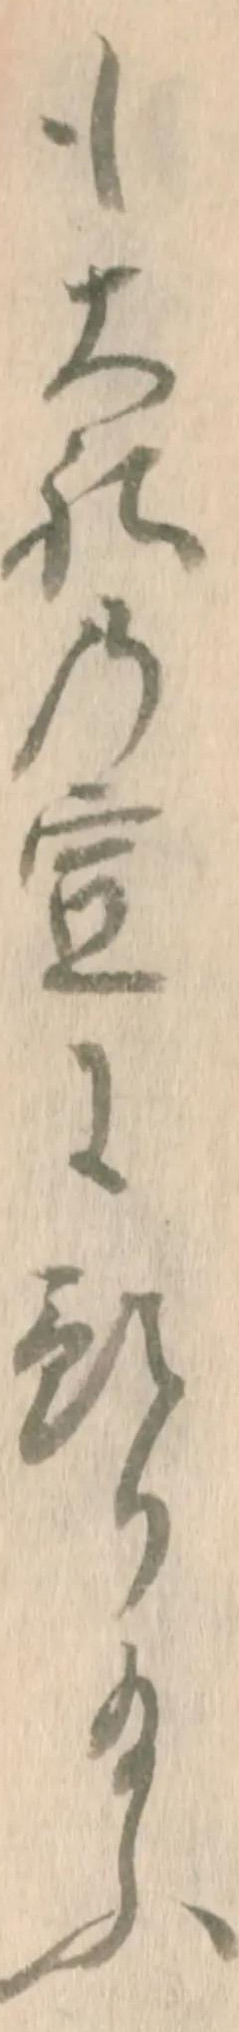も大社の宣に預り給ふ
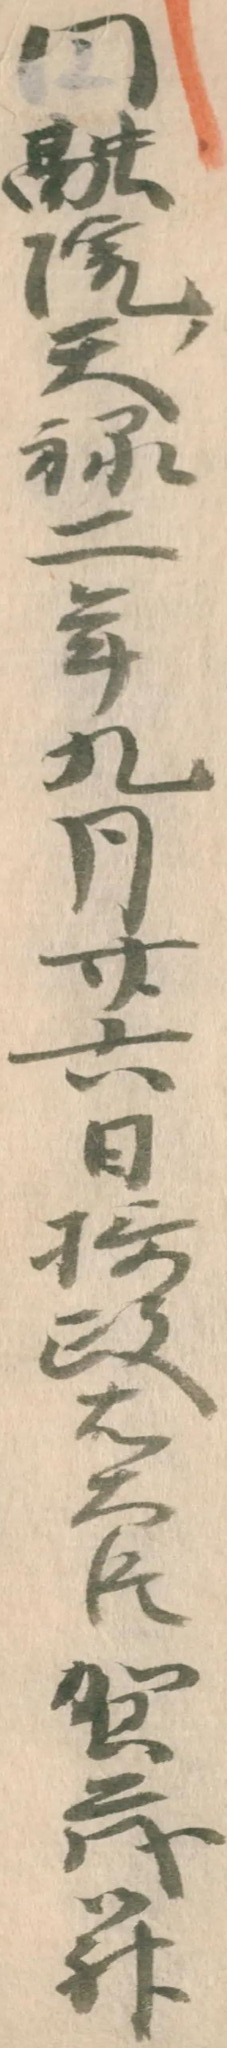円融院天禄二年九月廿六日摂政右大臣賀茂御神
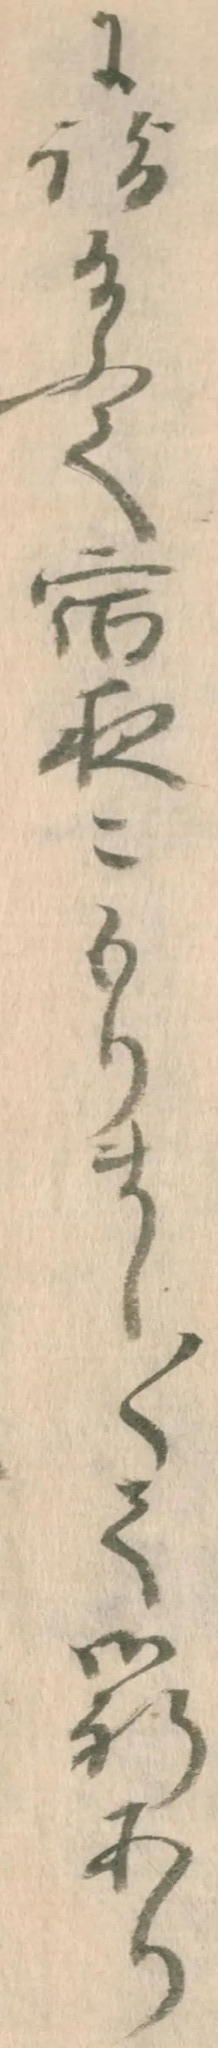に詣給ふて宿夜こもりまし〳〵て御祈あり
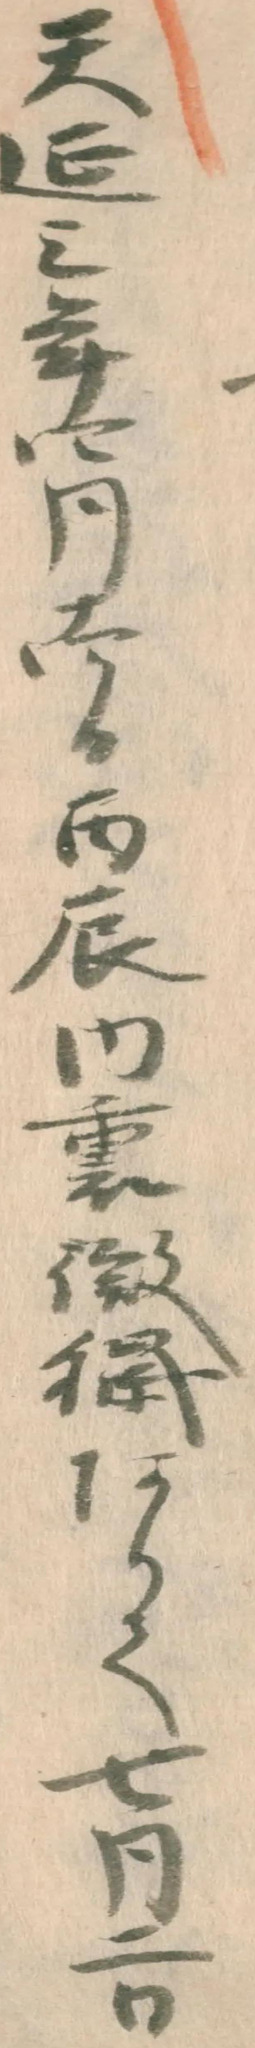天延三年四月十四日丙辰内裏微穢ありて七月二日
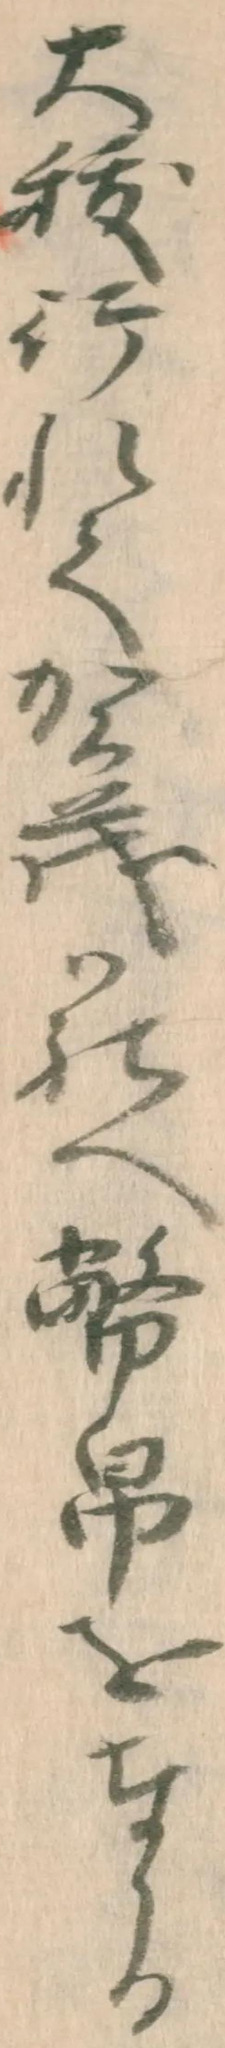大祓行れて賀茂御社へ幣帛を奉らる
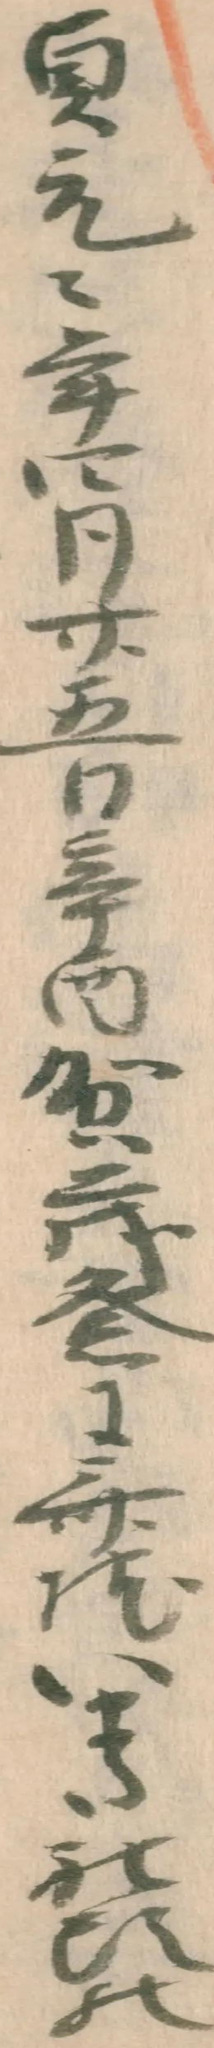貞元々年四月廿五日辛酉賀茂祭に斎院いまた社頭の
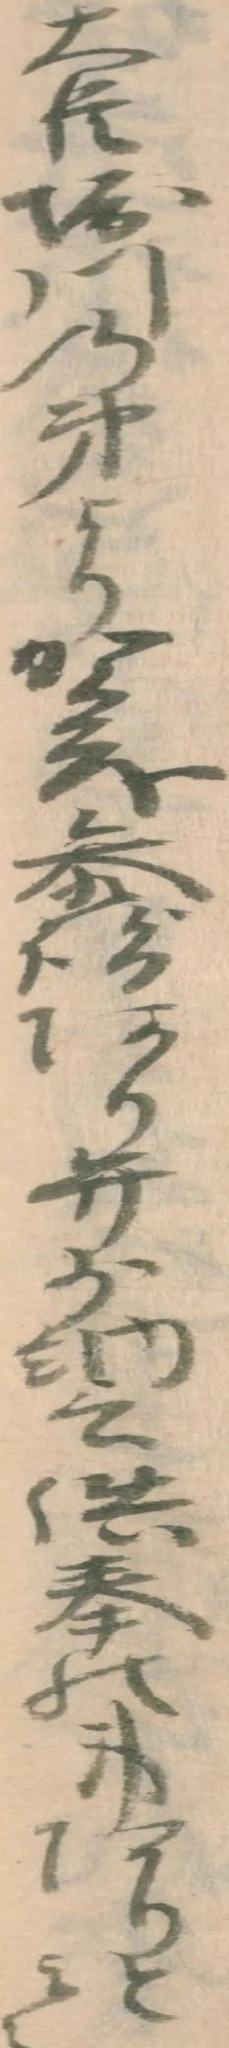大臣堀川の第より賀茂参詣あり弁少納言供奉の事ありと云々
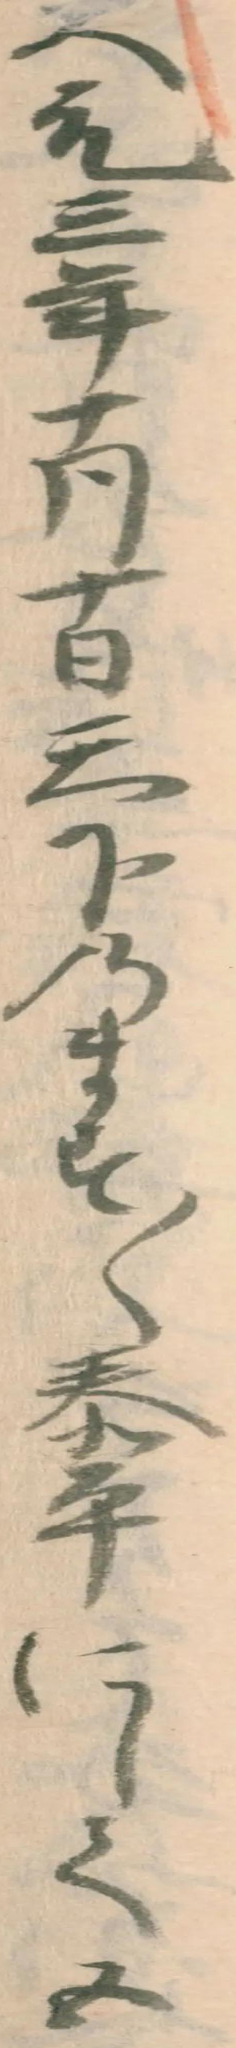天元三年十月十日天下のます〳〵泰平にして五
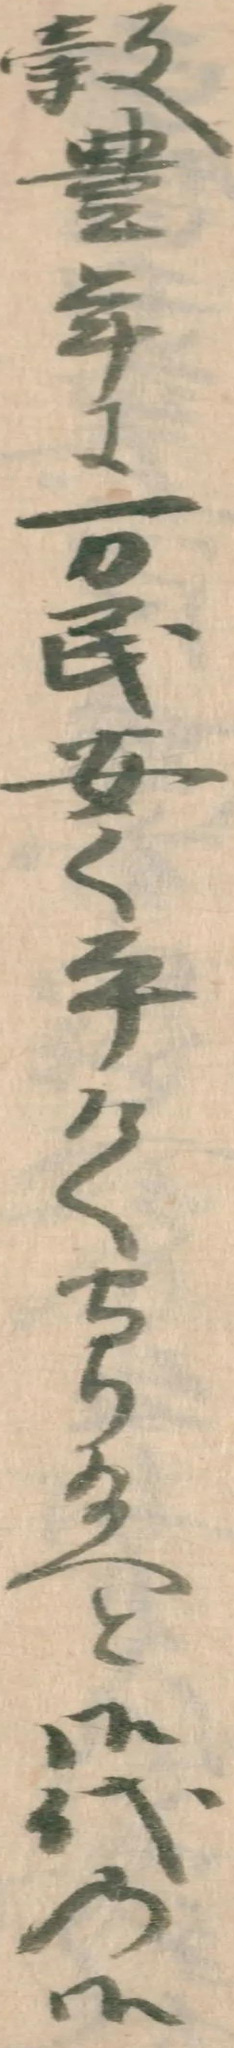穀豊年に万民安く平けく守り給へと御代の御
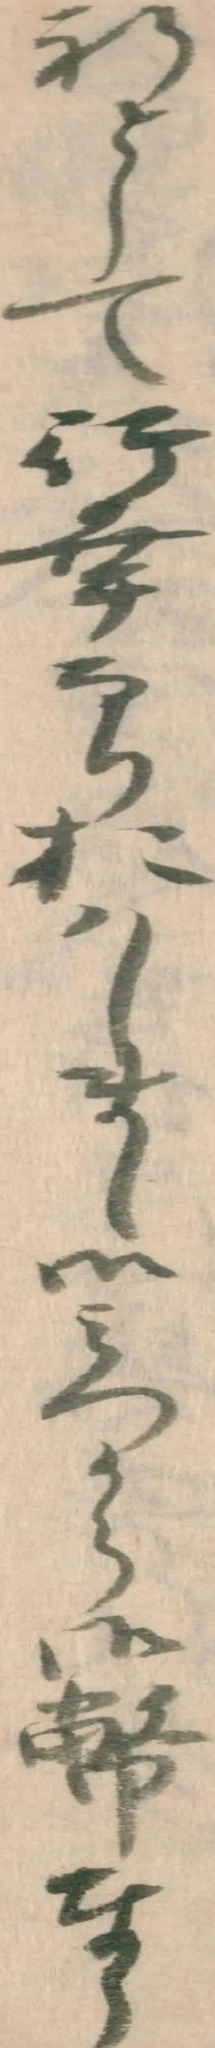祈として行幸なりおはしまし御みつから御幣奉ら
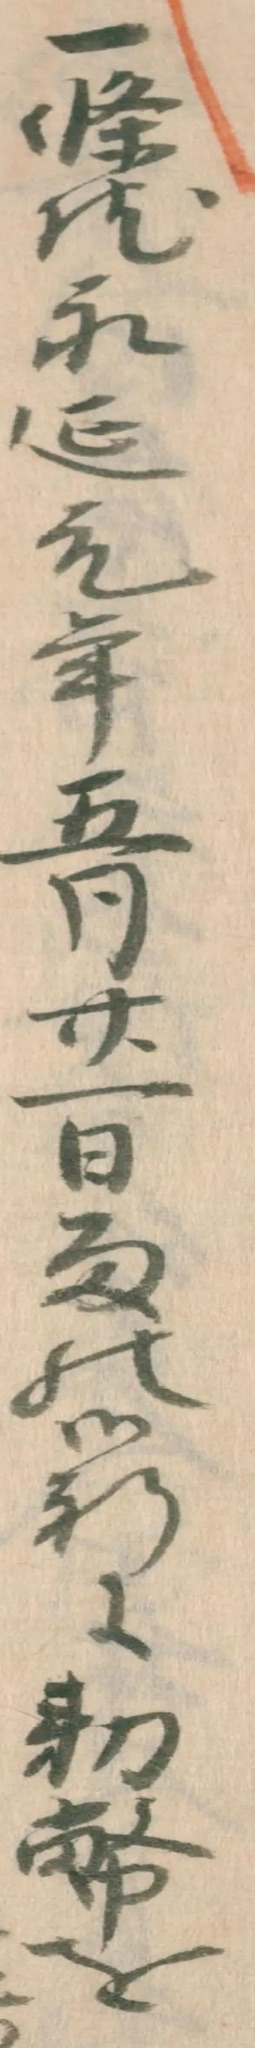一條院永延元年五月廿一日雨の御祈に勅幣を貴ふね
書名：賀茂社記録. 第1冊
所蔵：国立国会図書館 National Diet Library, JAPAN
